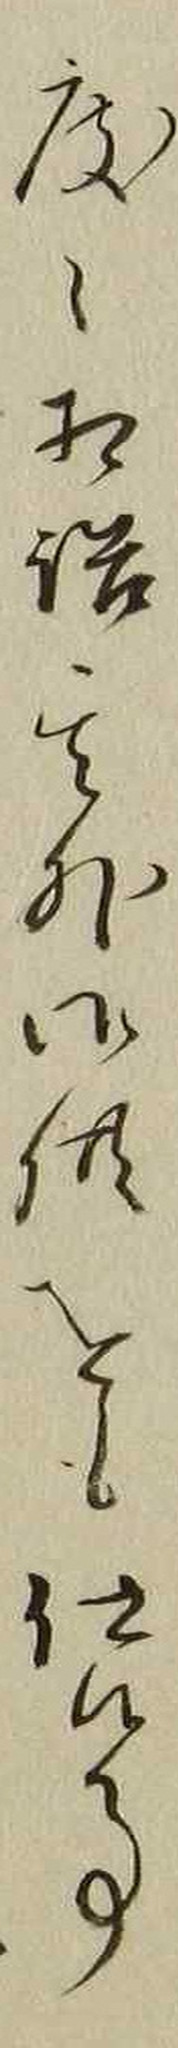度々相詰其外御供をも仕候事
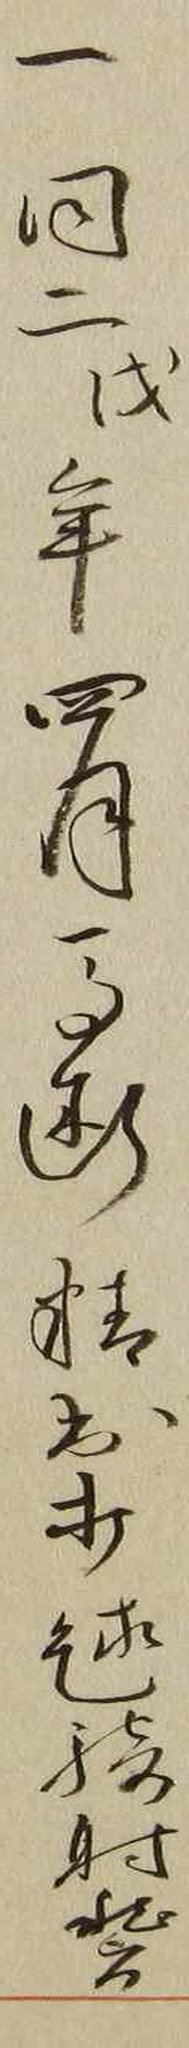一同二戌年四月馬術精出打毬騎射稽
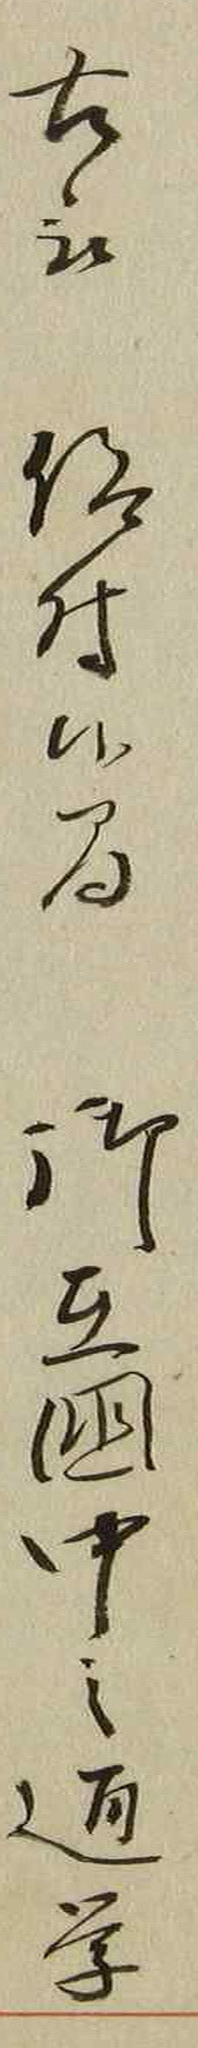古被仰付候間御在国中の通学
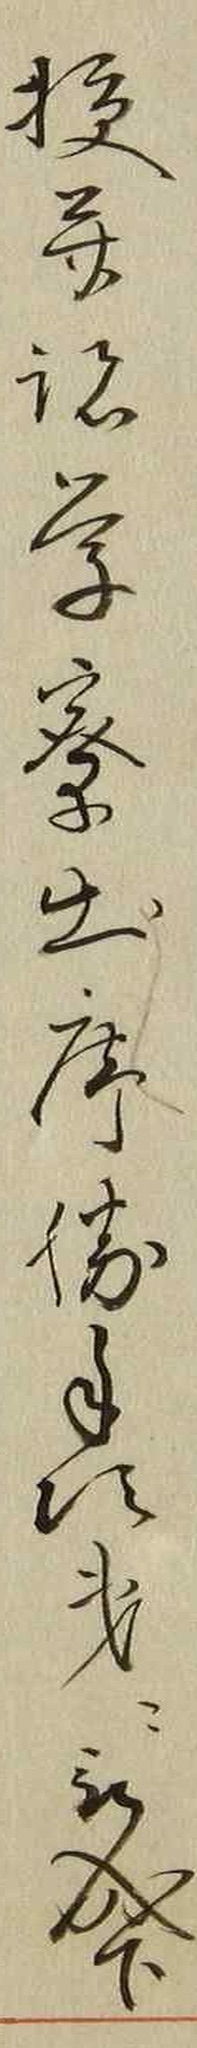校并諸学寮出席勝手次第に被成下
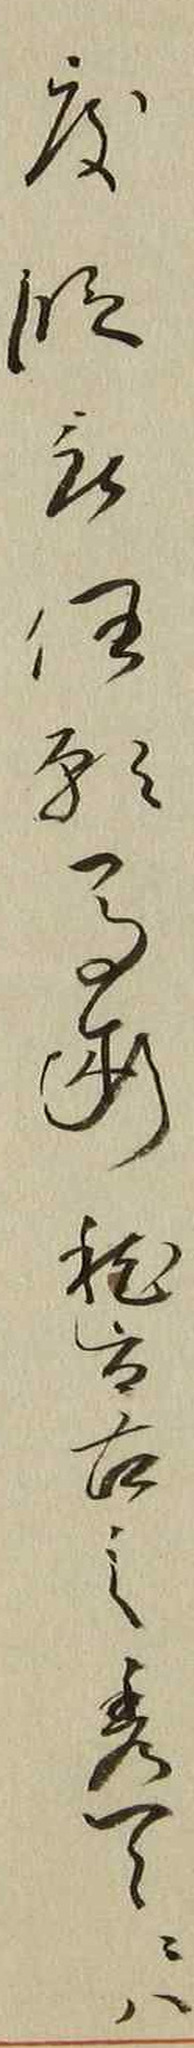度段被任願馬術稽古之秀了には
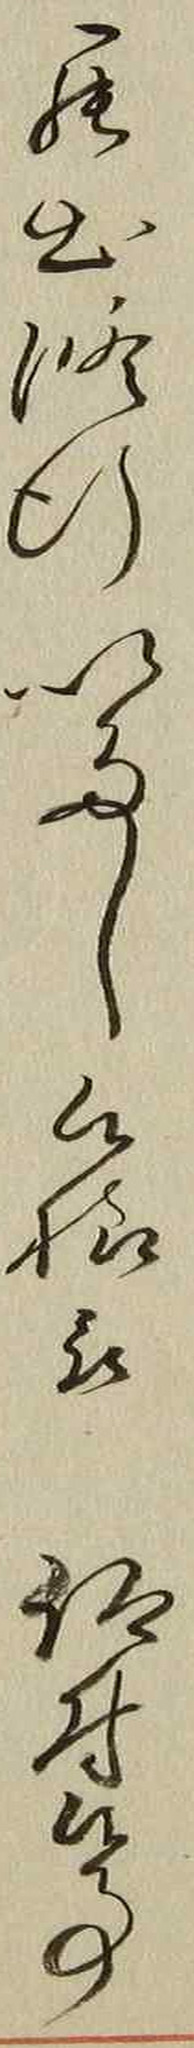罷出修行いたし候様被仰付候事
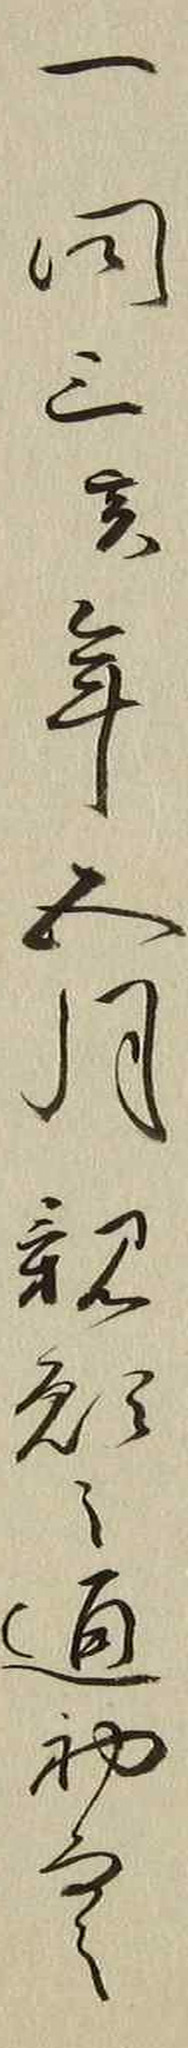一同三亥年五月親願の通初而之
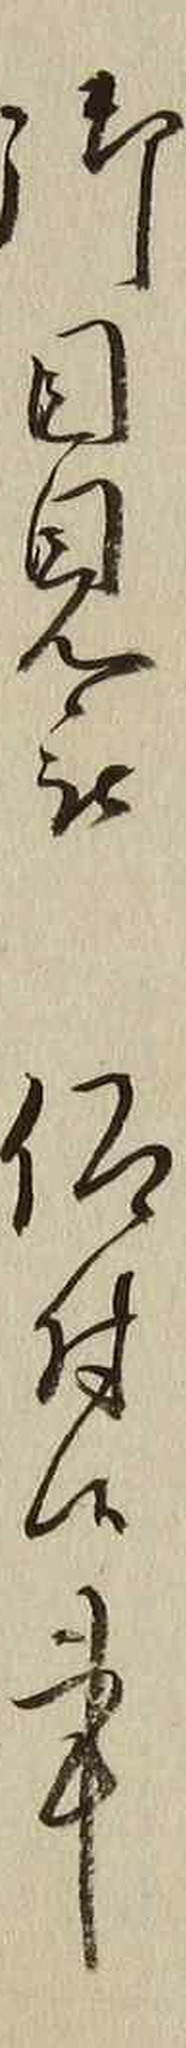御目見被仰付候事
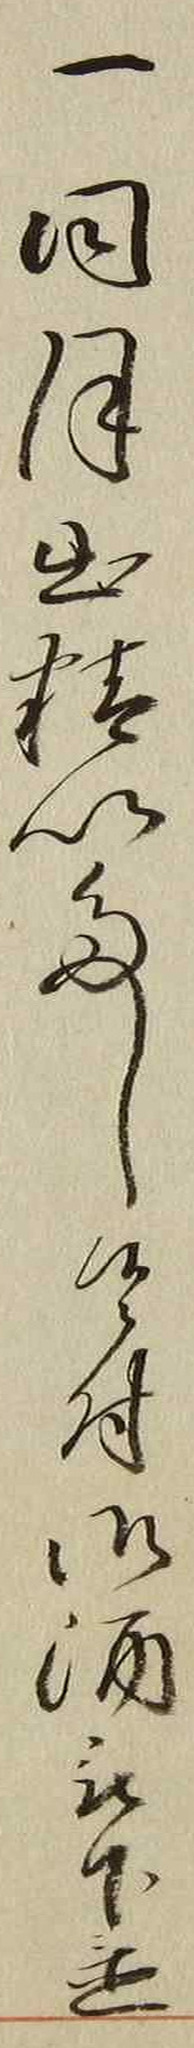一同月出精いたし候に付御酒被下置
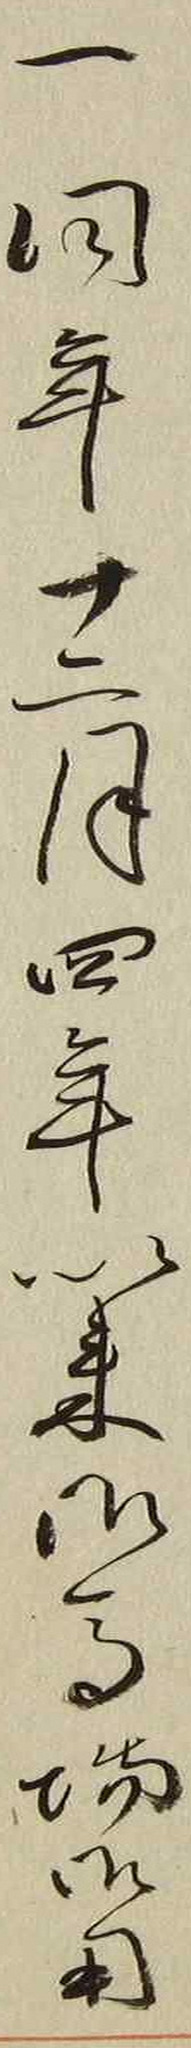一同年十二月四年以来御馬場御用
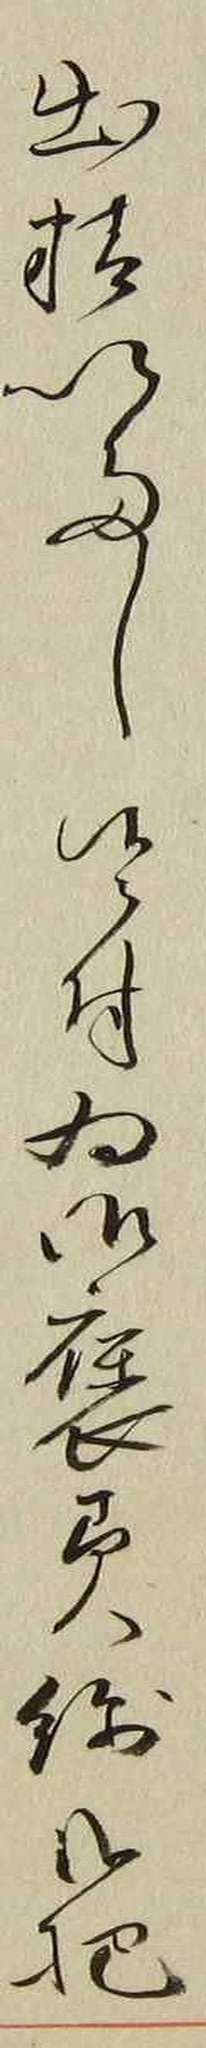出精いたし候に付為御褒美綿弐把
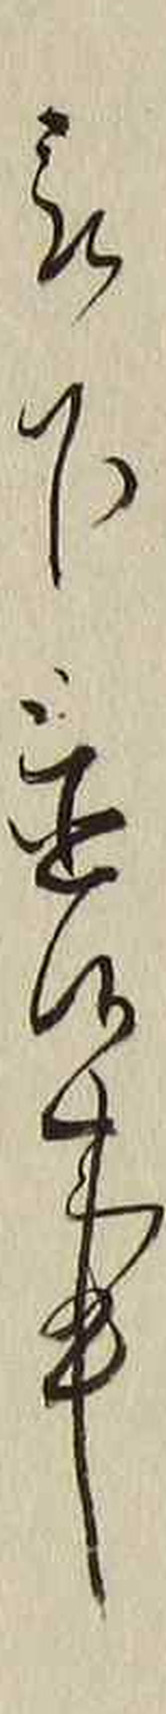被下置候事
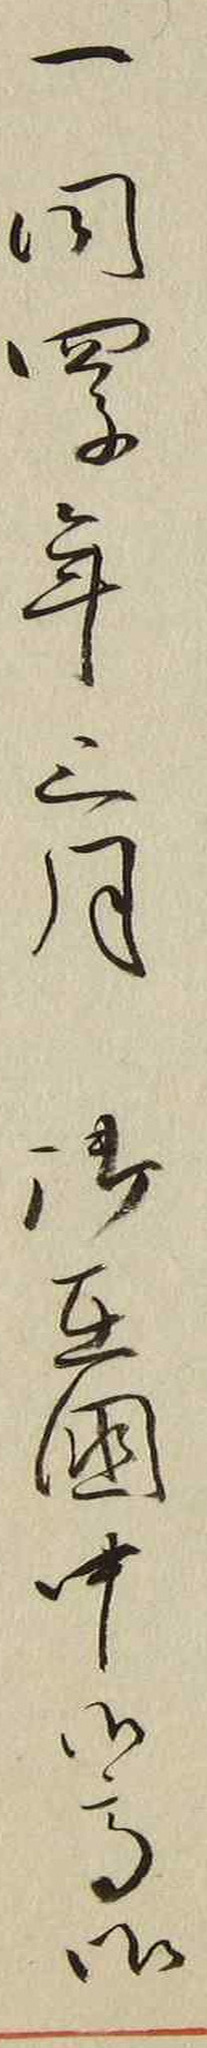一同四子年三年御在国中御馬御
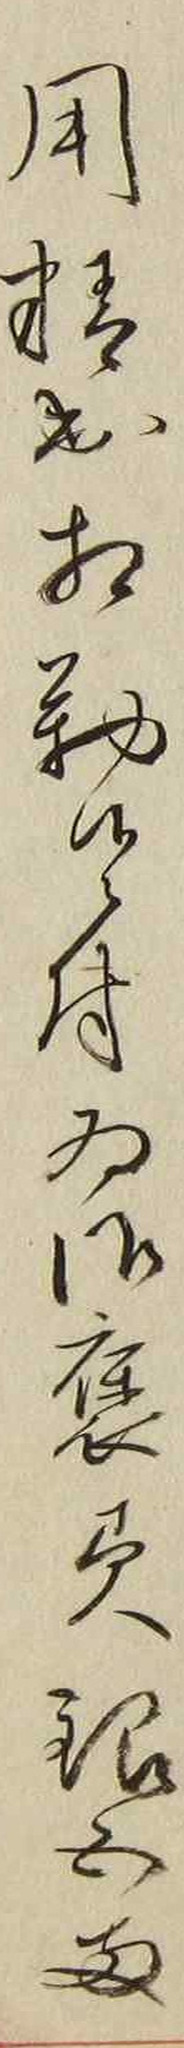用精出相勤候に付為御褒美銀五両

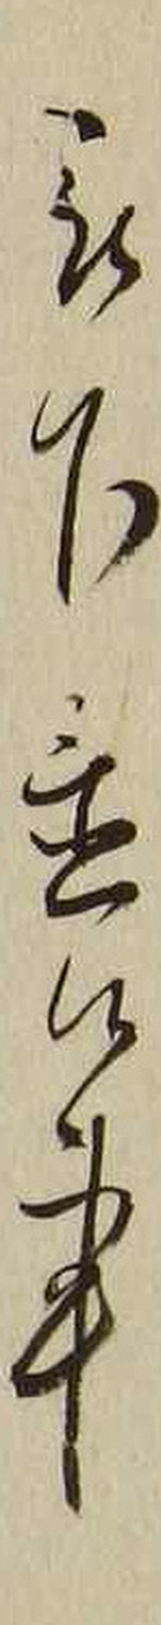被下置候事
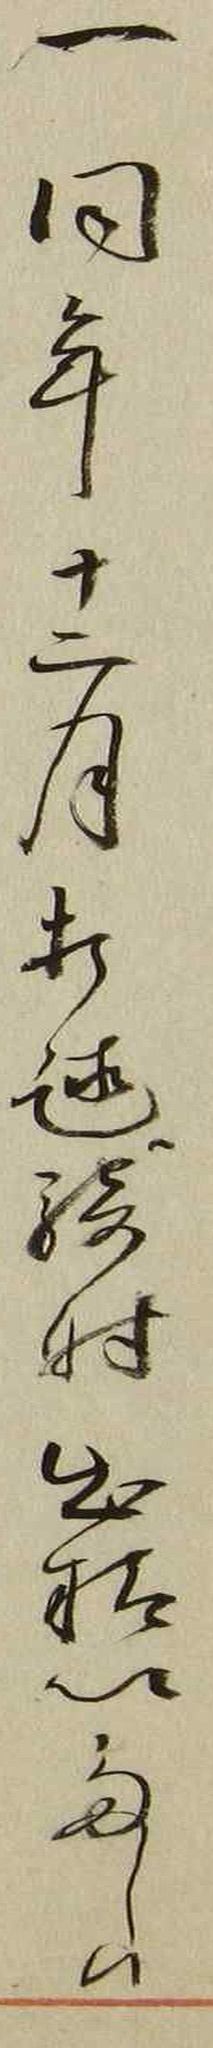一同年十二月打毬騎射出精いたし候
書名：諸士系譜　巻之3　い之部3
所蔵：会津若松市立会津図書館
